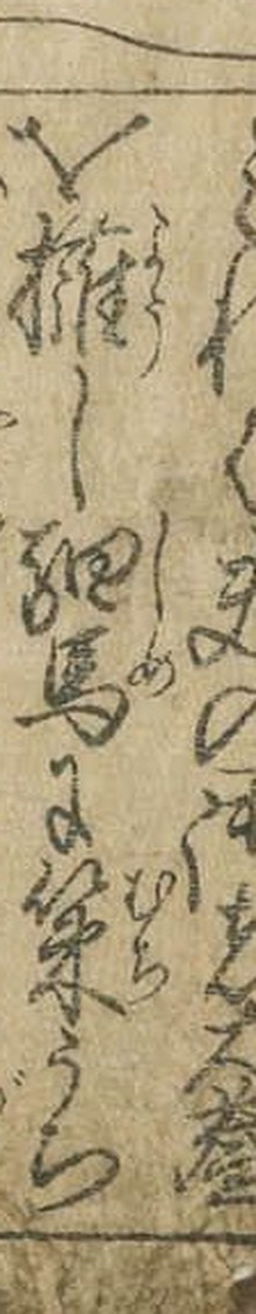を擁し駟馬に策うち
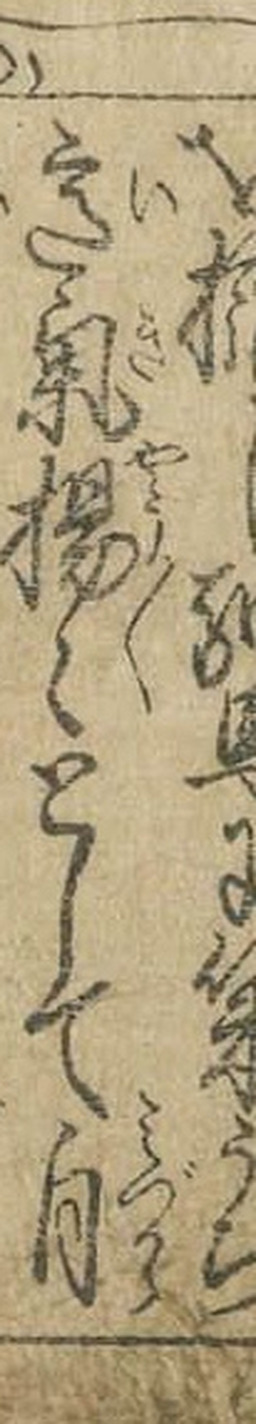意気揚々として自
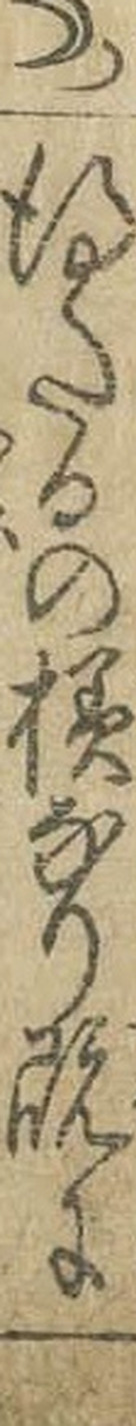得たるの様なり既に
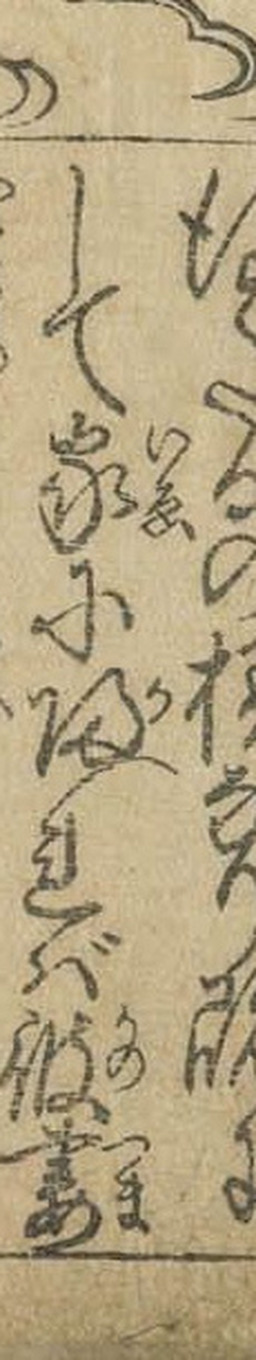して家に帰れば彼妻
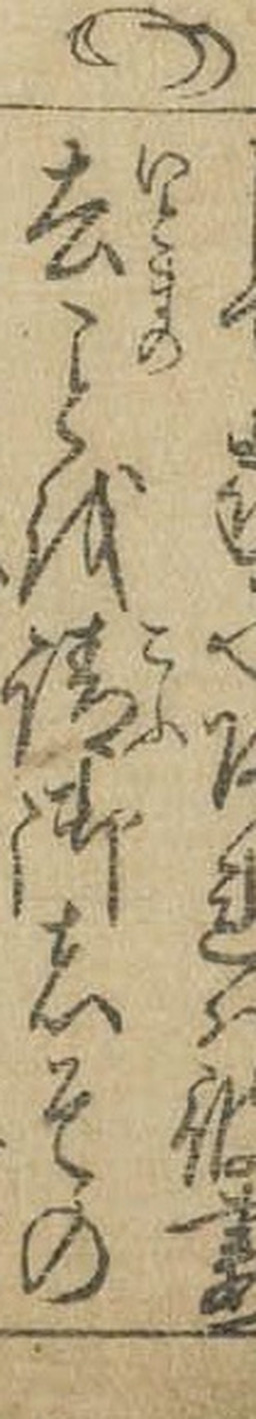去ことを請御者その
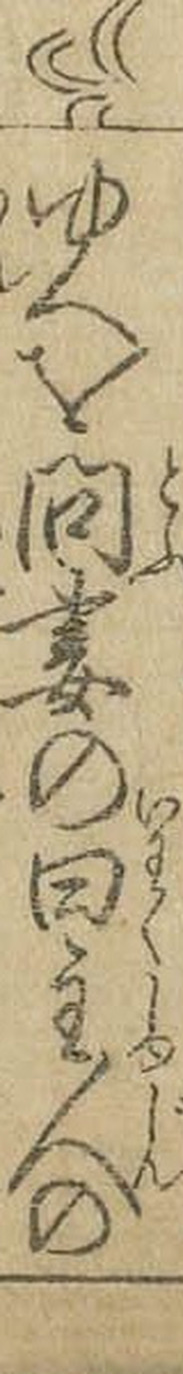ゆへを問妻の曰主人の
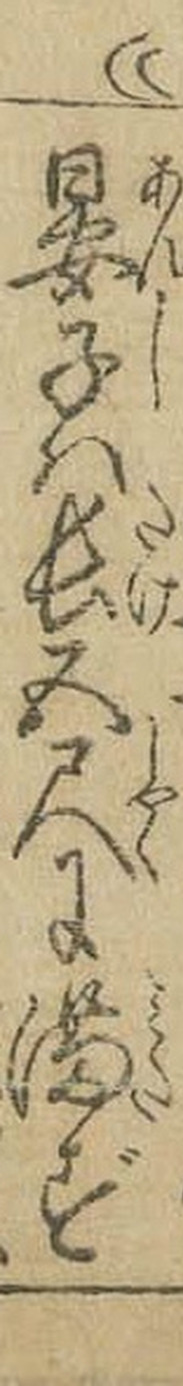晏子は長五尺に満ず
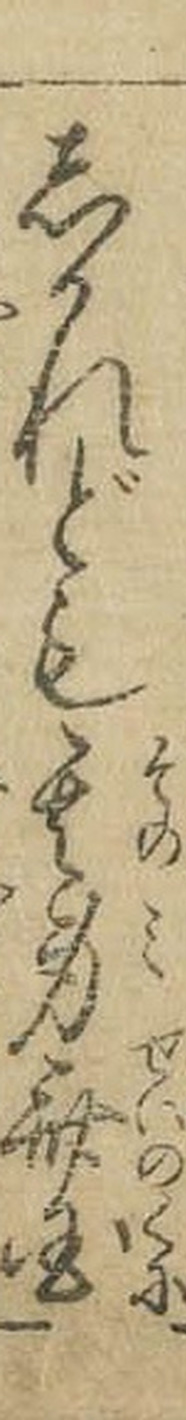しかれども其身斉国
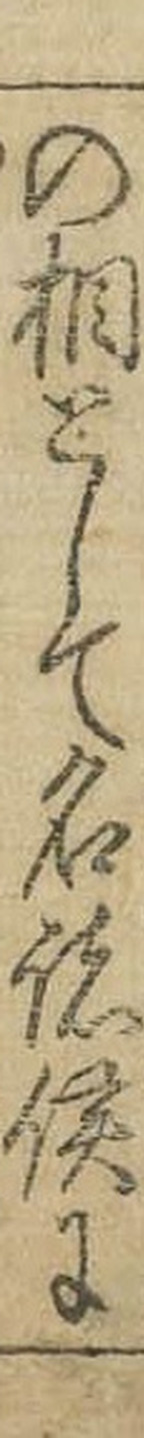の相として名諸侯に
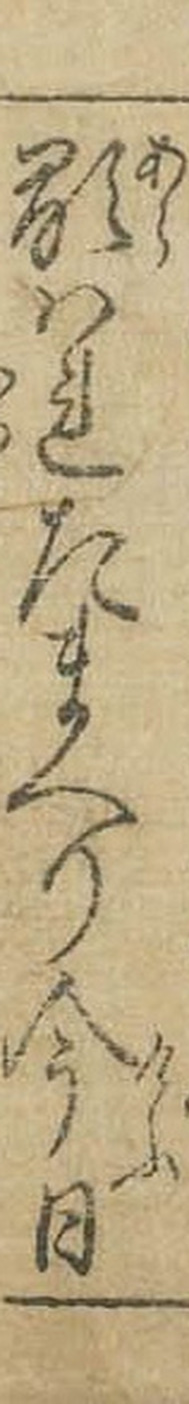顕はれたまへり今日
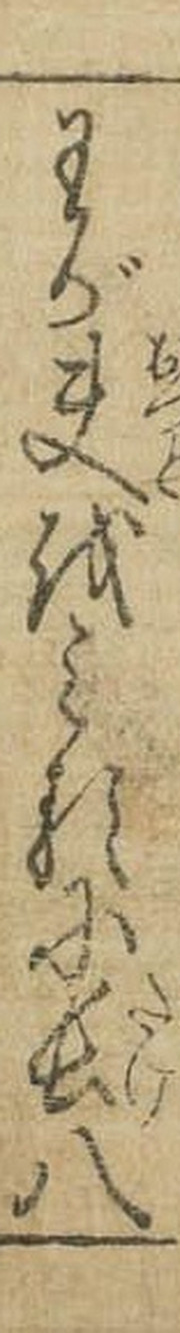わが夫をみるに長八
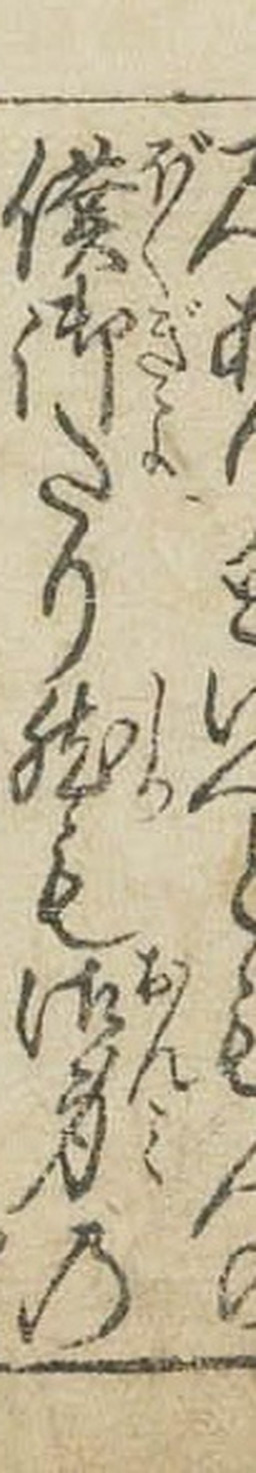僕御たり然も御身の
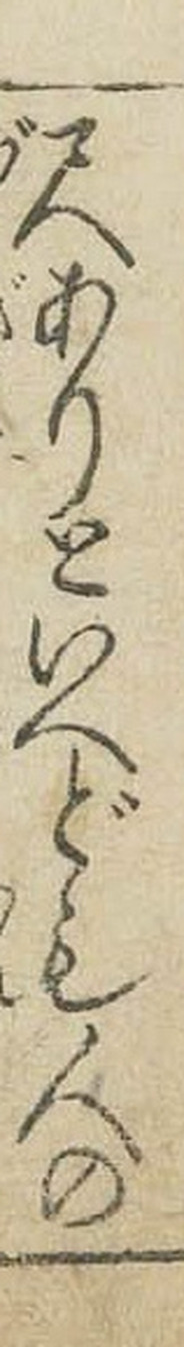尺ありといへども人の
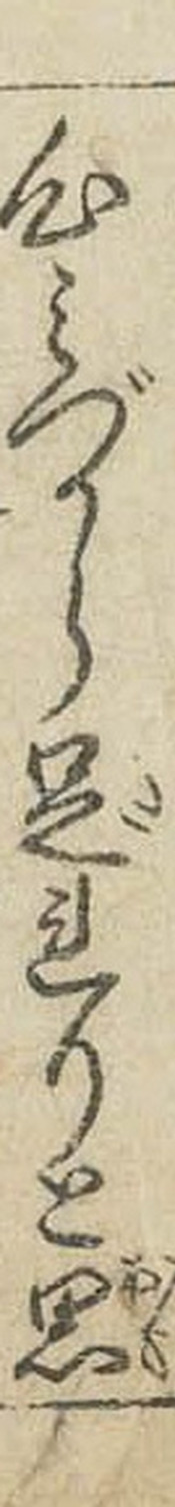心みづから足れりと思
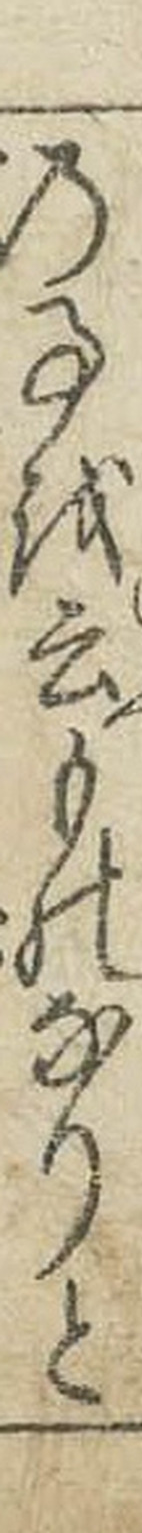の事を云ものなりと
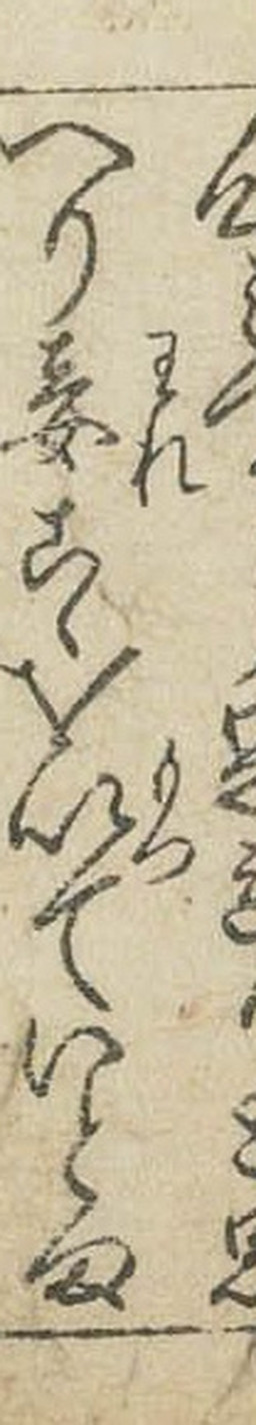へり妾こゝを以ていとま
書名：絵本写宝袋 9巻 6之巻
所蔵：東京学芸大学教育コンテンツアーカイブ
